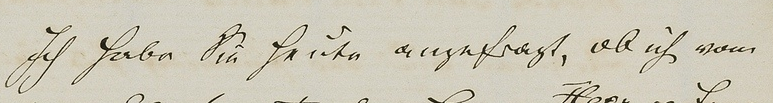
Ich habe Sie heute angefragt, ob ich von
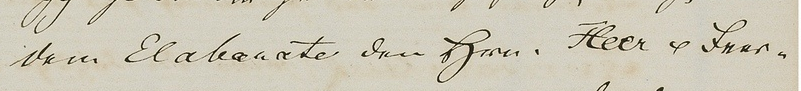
dem Elaborate den Hrn. Heer & Feer-
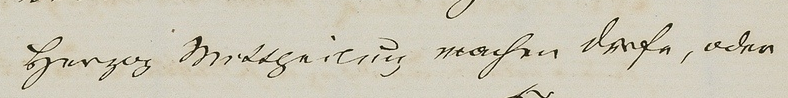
Herzog Mittheilung machen dürfe, oder
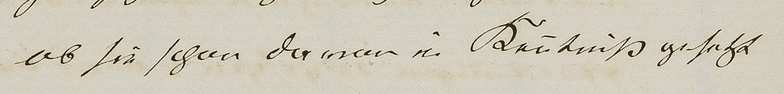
ob sie schon davon in Kenntniß gesetzt
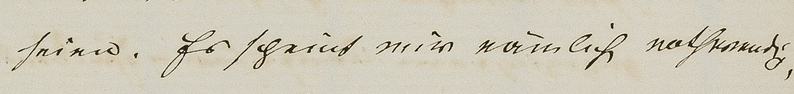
seien. Es scheint mir nämlich nothwendig,
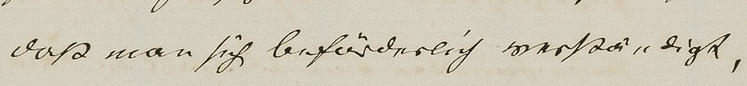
daß man sich beförderlich verständigt,
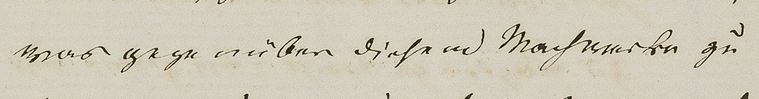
was gegenüber diesem Machwerke zu
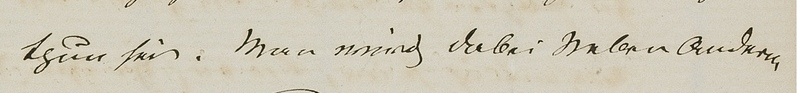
thun sei: Man wird dabei neben Anderm
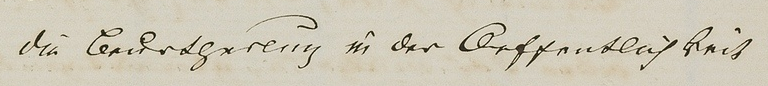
die Beurtheilung in der Oeffentlichkeit
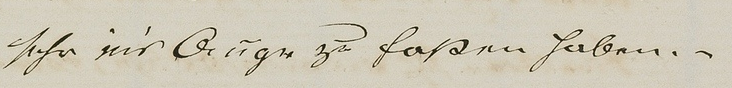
sehr in's Auge zu faßen haben. –
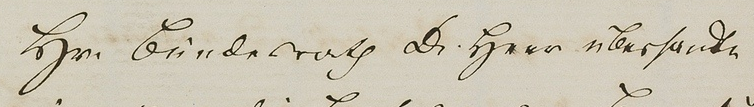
Hr. Bundesrath Dr. Heer übersandte
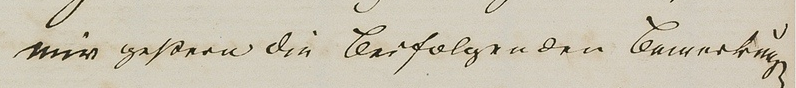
mir gestern die beifolgenden Bemerkungen
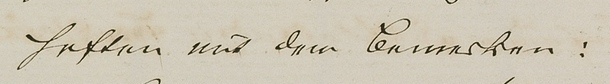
heften mit dem Bemerken:
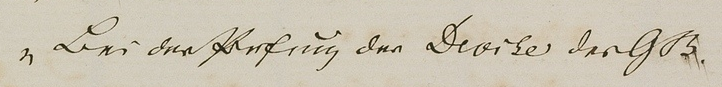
«Bei der Prüfung der Devise der GB.
